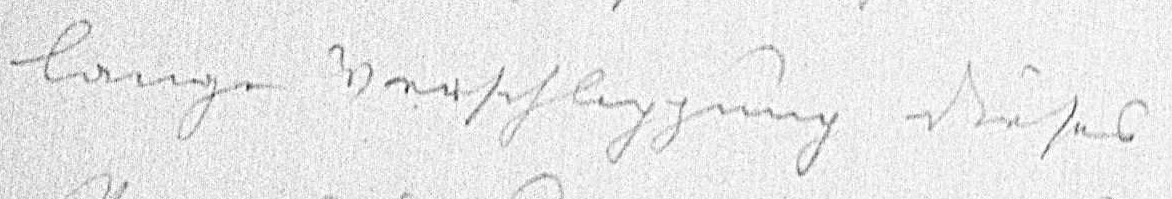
die lange Verschleppung dieses
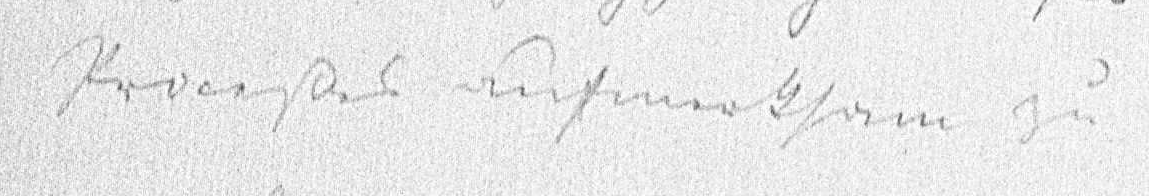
Proceßes aufmerksam
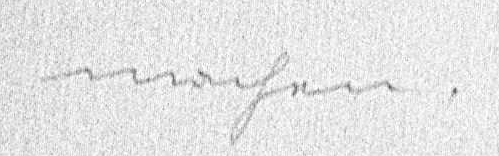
zu machen.
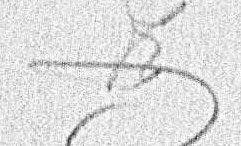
FJ“]
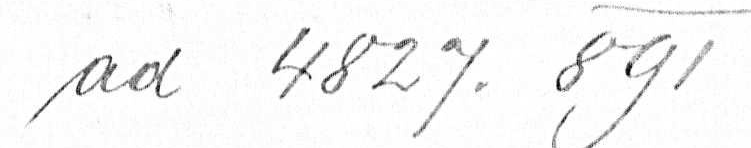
ad 4827
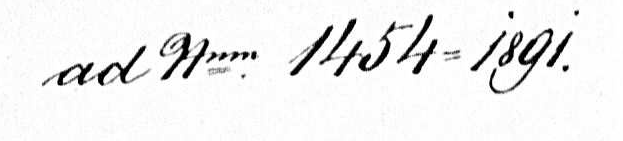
ad Num. 1454 1891
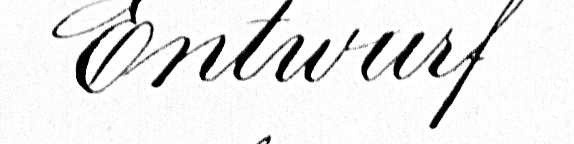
Entwurf
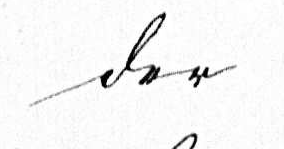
der
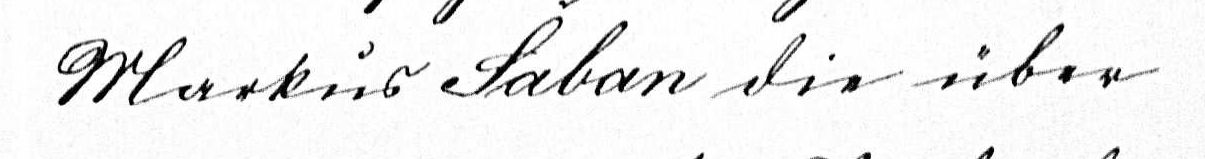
Markus Šaban die über
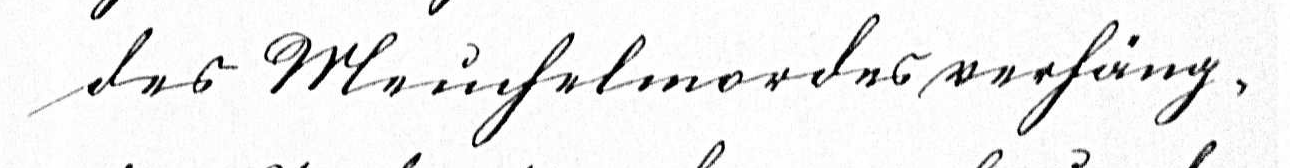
des Meuchelmordes verhäng¬
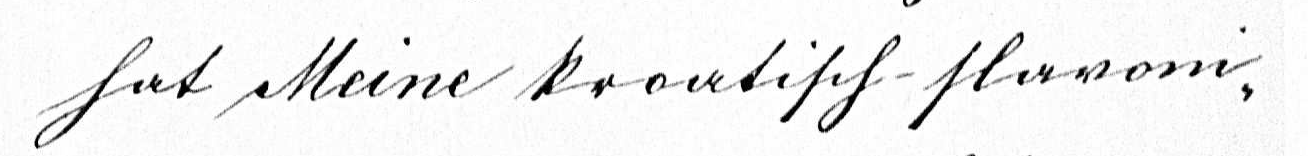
hat Meine kroatisch-slavoni¬
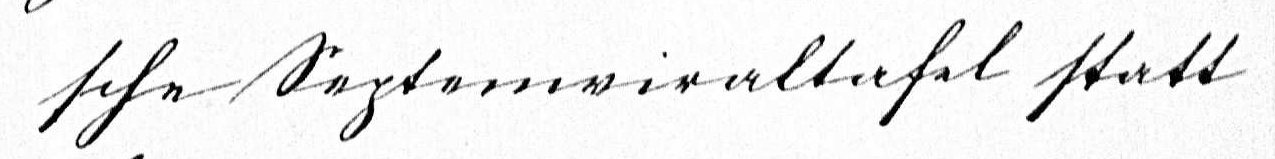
sche Septemviraltafel statt
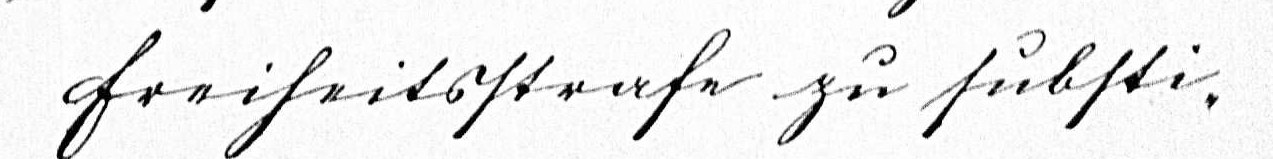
Freiheitsstrafe zu substi¬
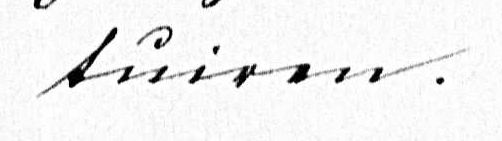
tuiren.
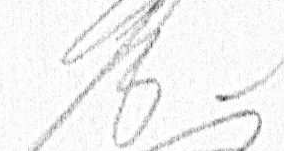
Gs.
